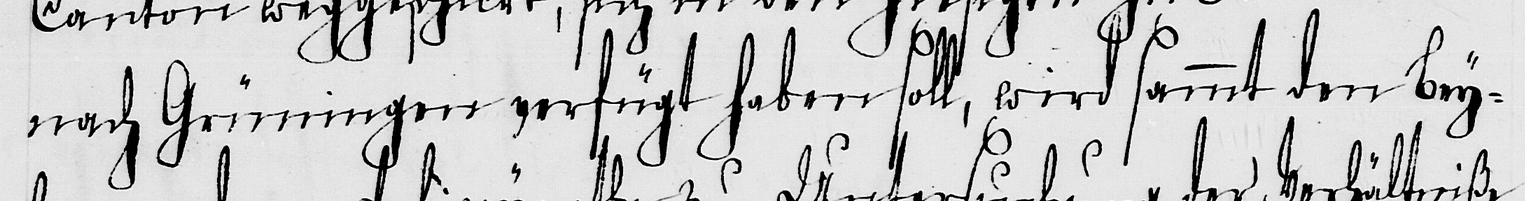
nach Grüningen verfügt haben soll, wird sammt den Bey¬
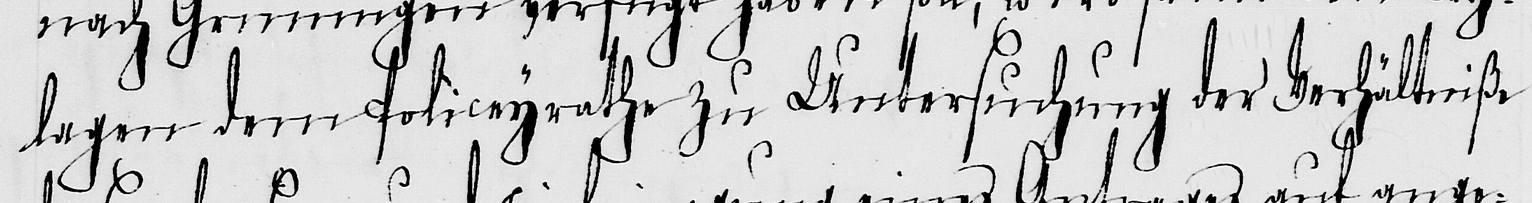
lagen dem Policeyrathe zu Untersuchung der Verhältniße
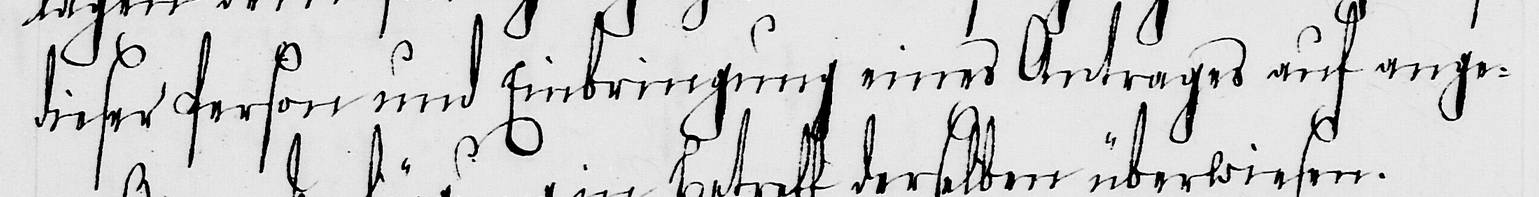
dieser Person und Einbringung eines Antrages auf ange¬
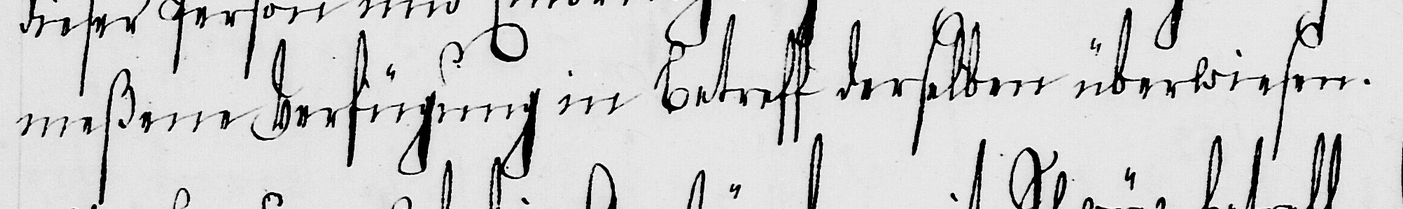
meßene Verfügung in Betreff derselben überwiesen.
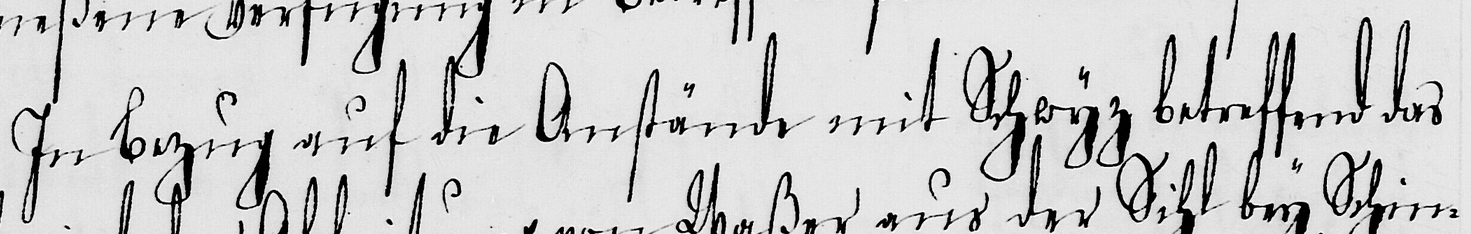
In Bezug auf die Anstände mit Schwyz betreffend
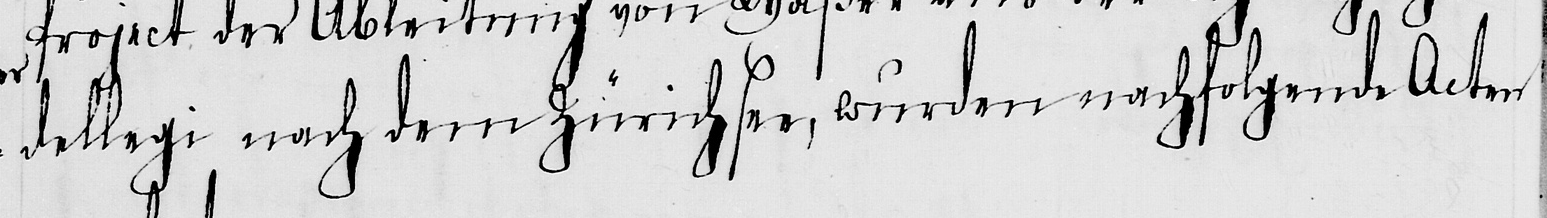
dellegi nach dem Zürichsee, wurden nachfolgende Acten
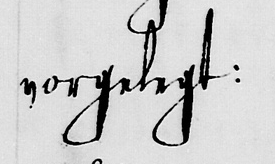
vorgelegt:
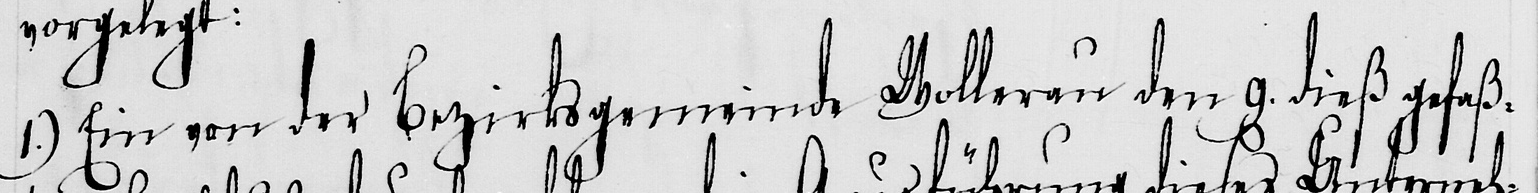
1.) Ein von der Bezirksgemeinde Wollerau den 9. dieß gefaß¬
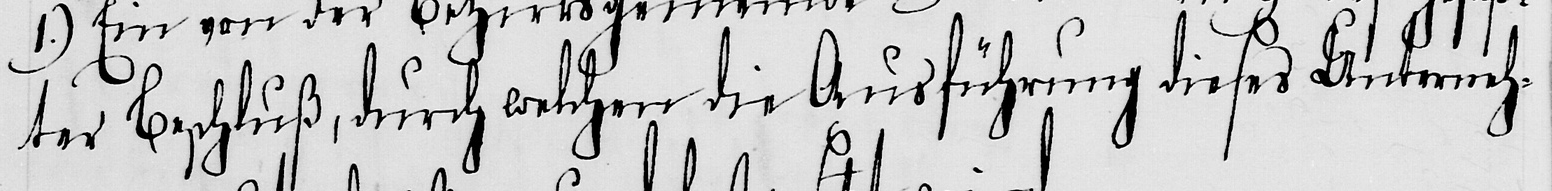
ter Beschluß, durch welchen die Ausführung dieses Unterneh¬
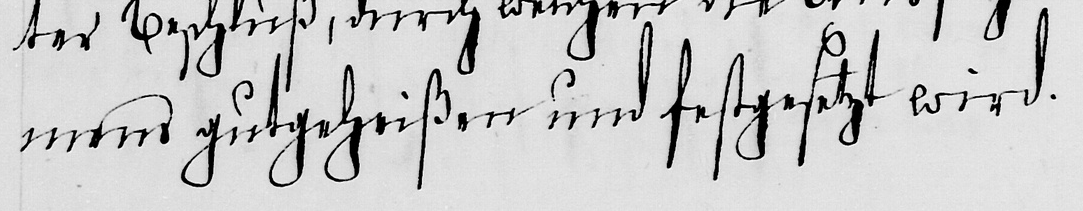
mens gutgeheißen und festgesetzt wird.
